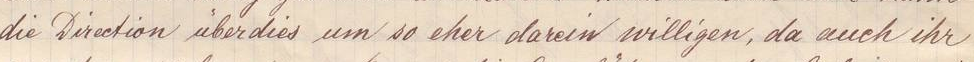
die Direction überdies um so eher darein willigen, da auch ihr
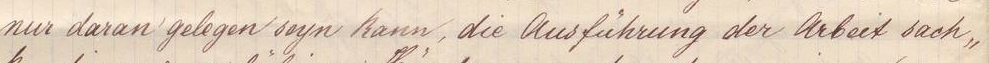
nur daran gelegen seyn kann, die Ausführung der Arbeit sach-
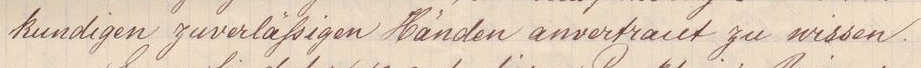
kundigen zuverläßigen Händen anvertraut zu wissen.
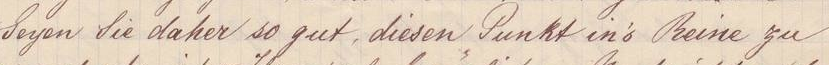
Seyen Sie daher so gut, diesen Punkt in's Reine zu
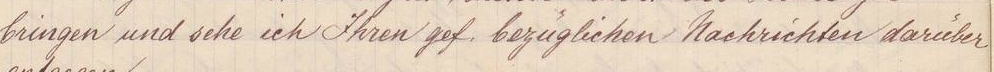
bringen und sehe ich Ihren gef. bezüglichen Nachrichten darüber
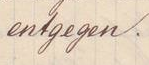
entgegen.
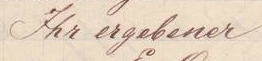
Ihr ergebener
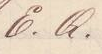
E. Q.»
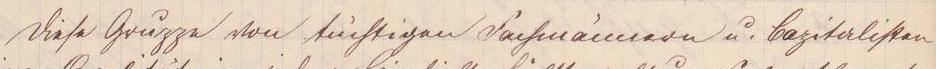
Diese Gruppe von tüchtigen Fachmännern u. Capitalisten
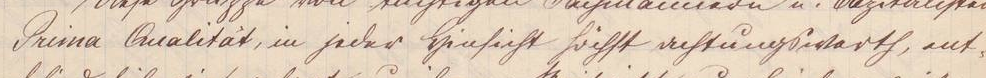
Prima Qualität, in jeder Hinsicht höchst achtungswerth, ent-
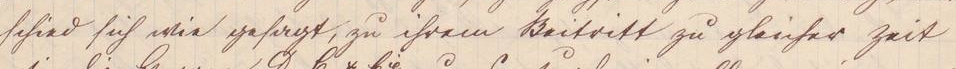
schied sich wie gesagt, zu ihrem Beitritt zu gleicher Zeit
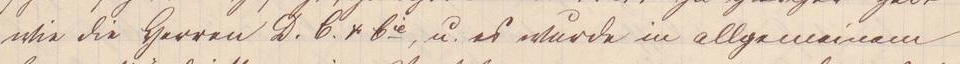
wie die Herren D. C. & Cie , u. es wurde in allgemeinem
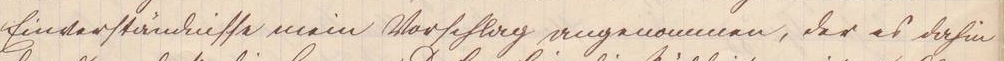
Einverständnisse mein Vorschlag angenommen, der es dahin
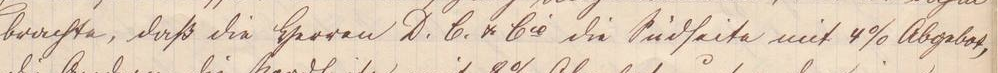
brachte, daß die Herren D. C. & Cie die Südseite mit 4% Abgebot,
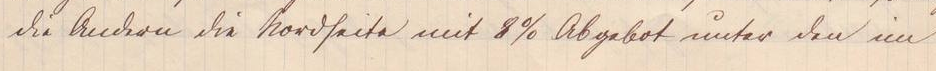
die Andern die Nordseite mit 8% Abgebot, unter den im
